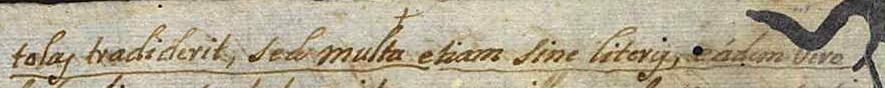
tolas tradiderit, sed multa etiam sine literis, e adem vero
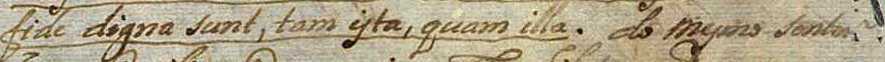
fide digna sunt, tam ista, quam illa. do mesmo sentir
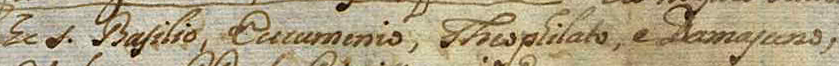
he s. Basilio, Eccumenio, Theoplilato, e Damasceno,
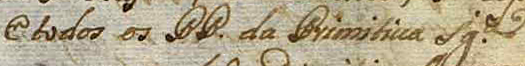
e todos os PP. da Primitiua Ig.a
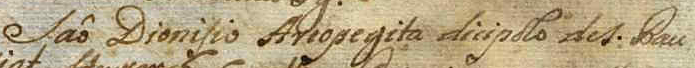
São Dionisio Areopegita dicipolo de S. Pau
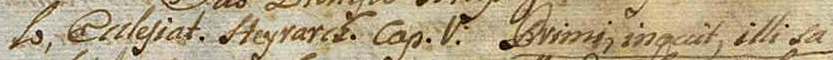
lo, Ecclesiat. Heyrarch. Cap. V: Primi, inquit, illi sa
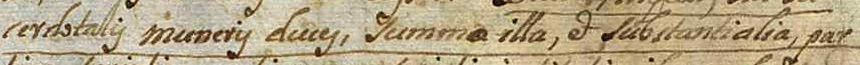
cerdotalis muneris deues, summa illa, et substantialia, par
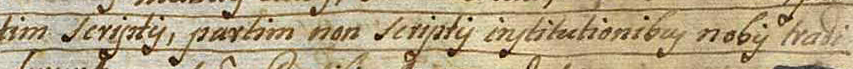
tim scriptis, partim non scriptis institutionibus nobis tradi
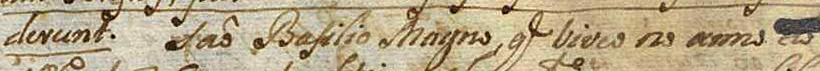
derunt. Saõ Basilio Magno, q̄ viveo no anno
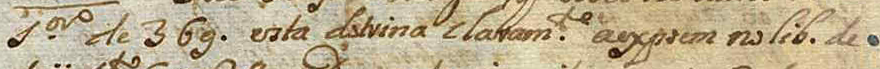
s.or de 369. esta dotrina claram.to a expoem no lib. de
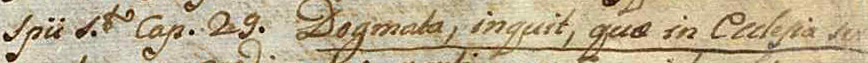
spii s.to Cap. 29. Dogmata, inquit, quæ in Ecclesia ser
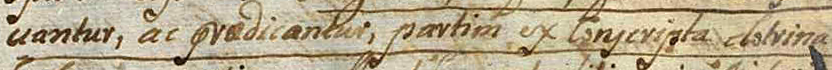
uantur, ac prædicantur, partim ex conscripta dotrina
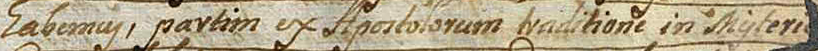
habemus, partim ex Apostolorum traditione in Misteri_
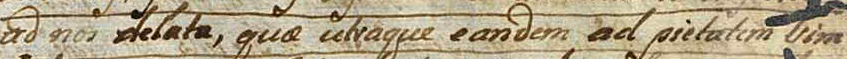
ad nos delata, quæ utraque eandem ad pietatem vim
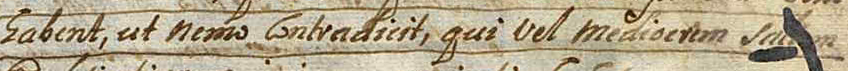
habent, ut nemo contradicit, qui vel mediocrem sal_m
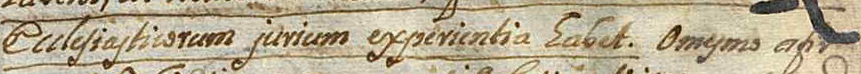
Ecclesiasticorum jurium experientia habet. O mesmo afir
